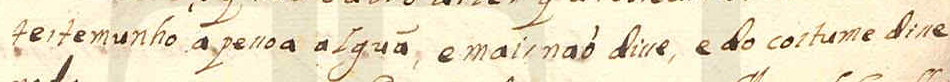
testemunho a pessoa alguā, e mais naõ disse, e do costume disse
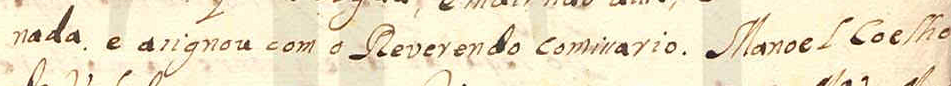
nada, e asignou com o Reverendo comissario. Manoel Coelho
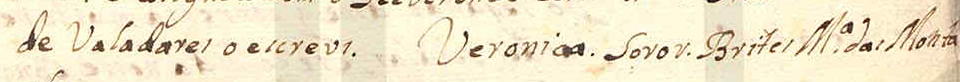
de Valadares o escrevi. Veronica. Soror. Brites M.a das Monta
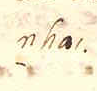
nhas.
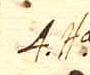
4. tt.a
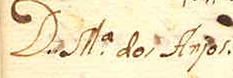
D. M.a dos Anjos.
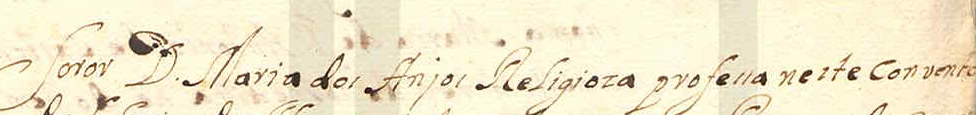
Soror D. Maria dos Anjos Religioza professa neste convento
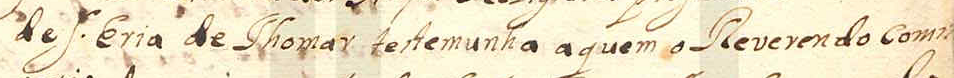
de S. Eria de Thomar testemunha a quem o Reverendo Comi
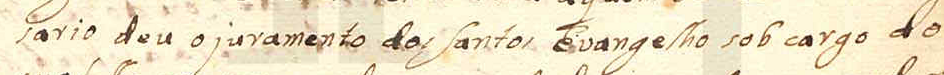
sario deu o juramento dos santos Evangelho sob cargo do
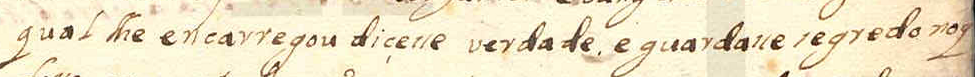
qual lhe encarregou dicesse verdade, e guardasse segredo no q
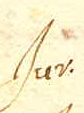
Jur.
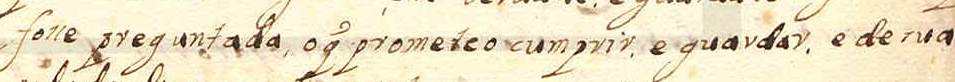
fosse preguntada, o q̄ prometeo cumprir, e guardar, e de sua
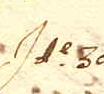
Jd.e 30.
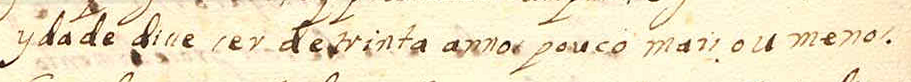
ydade disse ser de trinta annos pouco mais ou menos
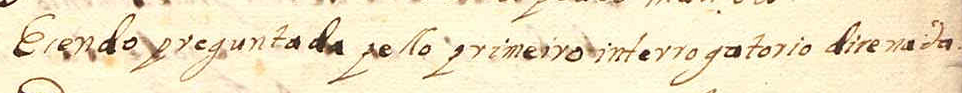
E sendo preguntada pello primeiro interrogatorio dise nada
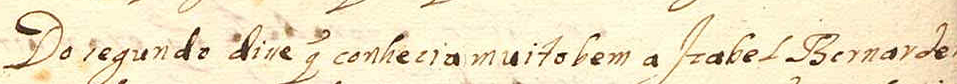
Do segundo disse q̄ conhecia muito bem a Jzabel Bernardes
